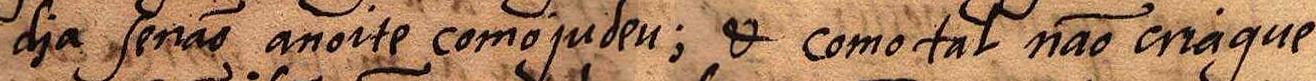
dia senaõ a noite como judeu; & como tal não cria que
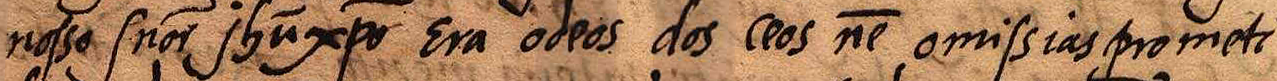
nosso snōr jhū xp̄o Era o deos dos ceos nē o missias prometi
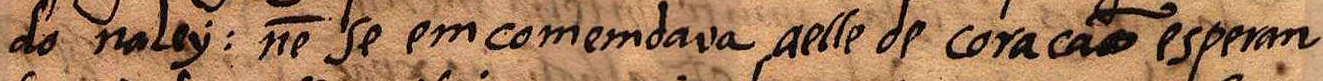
do na Ley: nē se emcomemdava a elle de coracaõ esperan
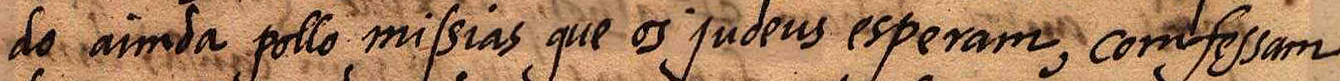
do aimda pollo missias que os judeus esperam, comfessam
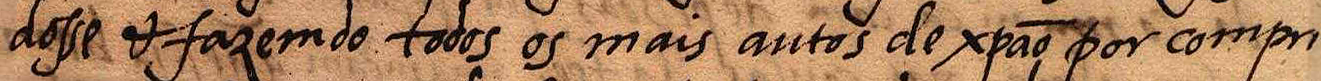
dosse & fazemdo todos os mais autos de xpaõ por compri
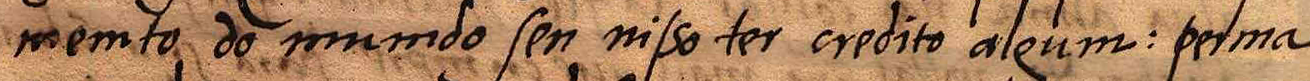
memto do mumdo sen nisso ter credito algum: perma
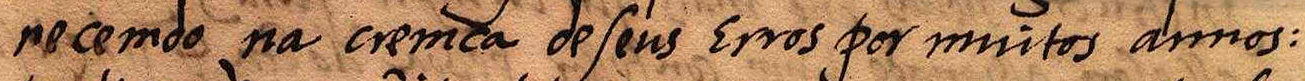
necemdo na cremca de seus Erros por muitos annos:
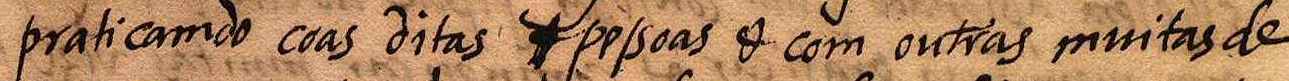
praticamdo co as ditas _ pessoas & com outras muitas de
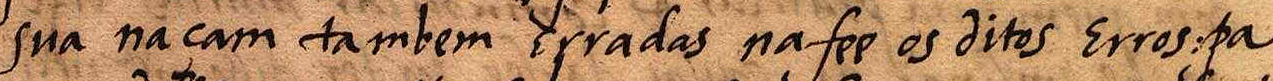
sua naçam tambem Erradas na fee os ditos Erros pa
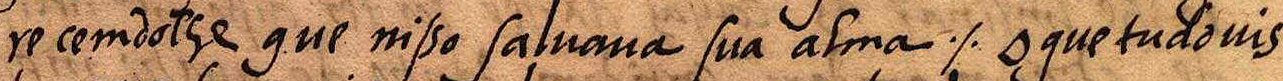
recemdolhe que nisso saluaua sua alma ./. O que tudo uis
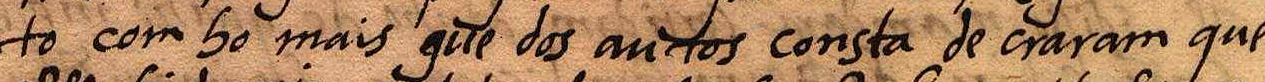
to com ho mais que dos autos consta decraram que
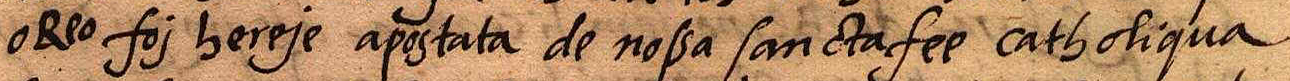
o Reo foj hereje apostata de nossa sancta fee catholiqua
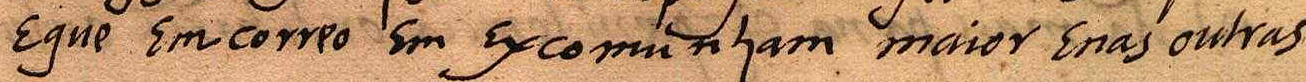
E que Emcorreo Em Excomunham maior E nas outras
